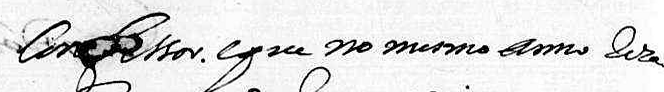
Confessor. e que no mesmo anno Reza
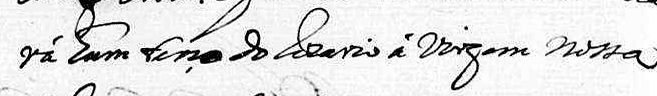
rá hum terço do Rozario á Virgem nossa
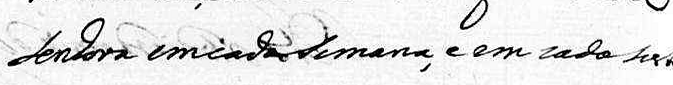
Senhora em cada semana, e em cada sesta
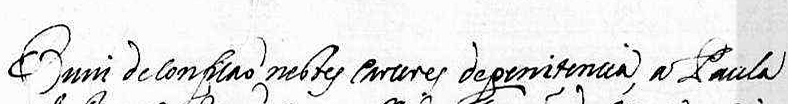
Ouui de confiçaõ nestes carceres de penitencia a Paula
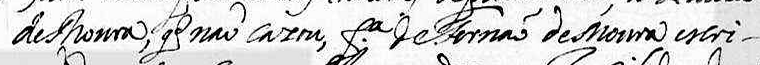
de Moura, q̄ naõ cazou, f.a de Fernaõ de Moura escri
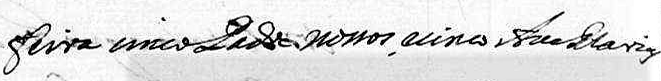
feira cinco Padre nossos, e cinco Aue Marias
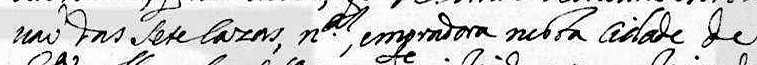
uaõ das sete cazas, n.al, e moradora nesta cidade de
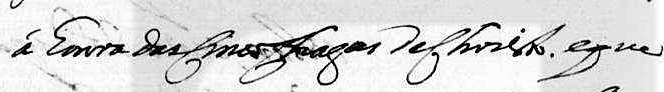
á honra das Cinco chagas de Christo. e que
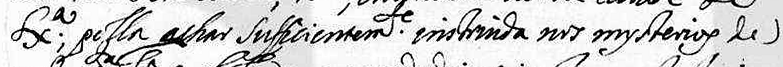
Lxa; pella achar sufficientemte. instruida nos mysterios de
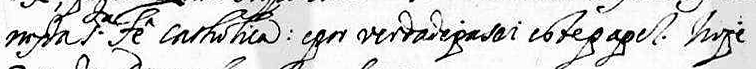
nossa sta Fe catholica: e por verdade pasei este papel. hoje
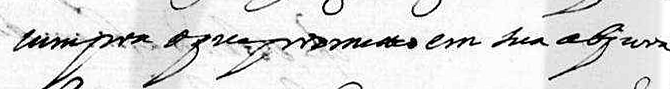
cumpra o que prometto em sua abjura
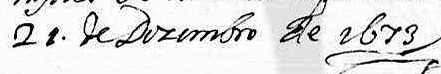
21. de Dezembro de 1673
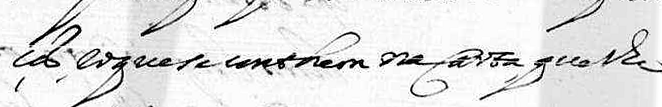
çaõ, e o que se conthem na Carta, que lhe
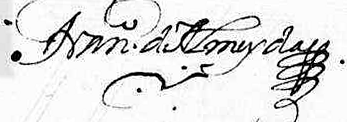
Fran.co de Almeyda.
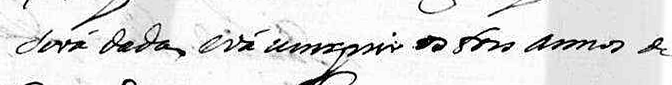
será dada erá cumprir os tres annos de
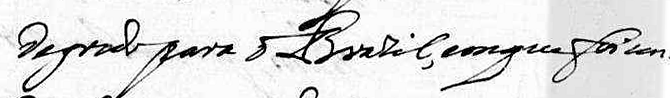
degredo para o Brazil, em que foi con
